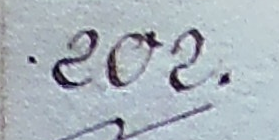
202.
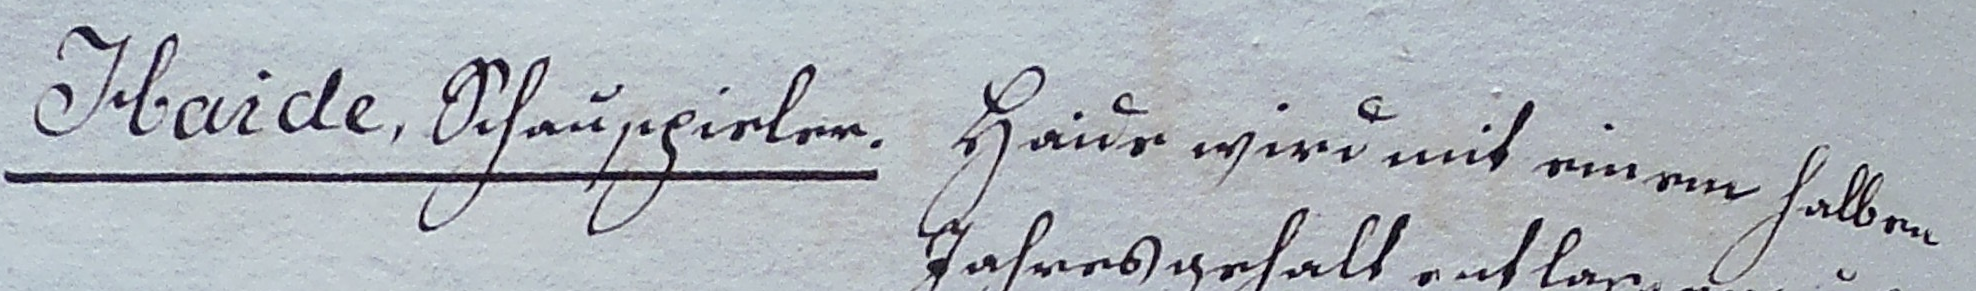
Haide, Schauspieler. Haide wird mit einem halben
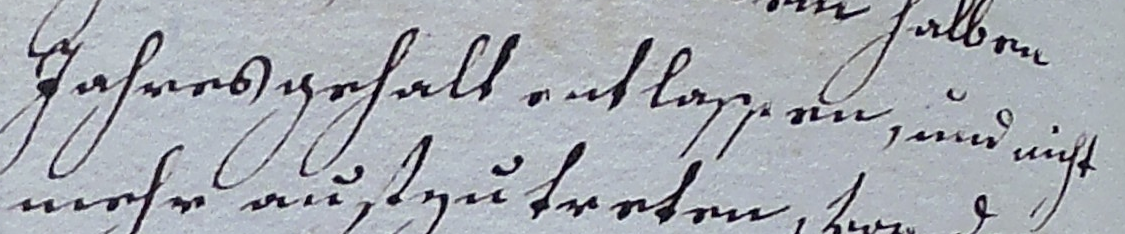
Jahresgehalt entlassen, und nicht
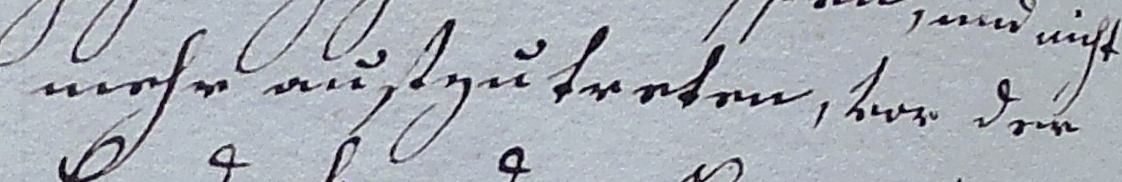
mehr aufzutreten, vor der
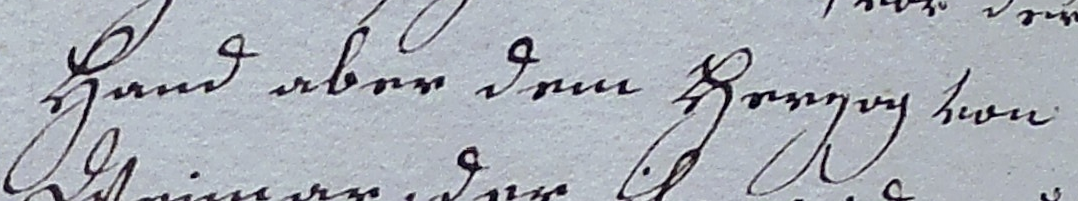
Hand aber dem Herzog von
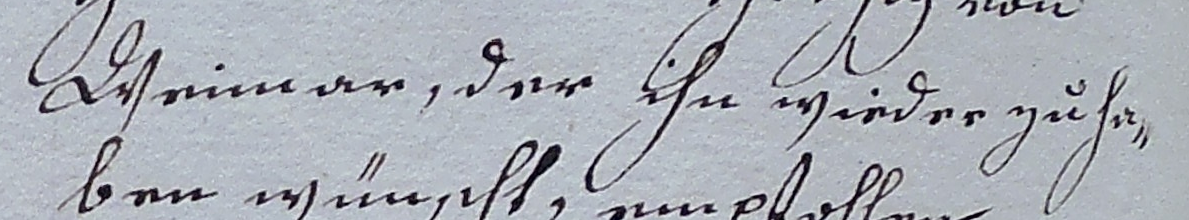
Weimar, der ihn wieder zu ha¬
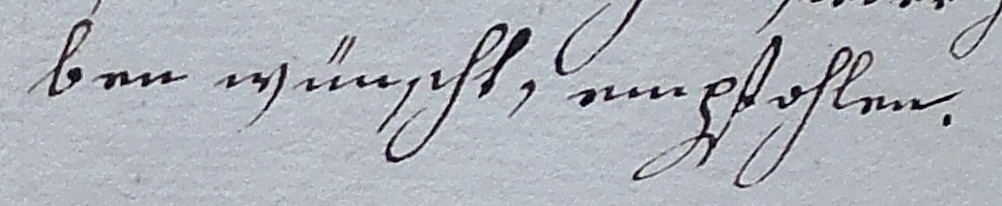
ben wünscht, empfohlen.
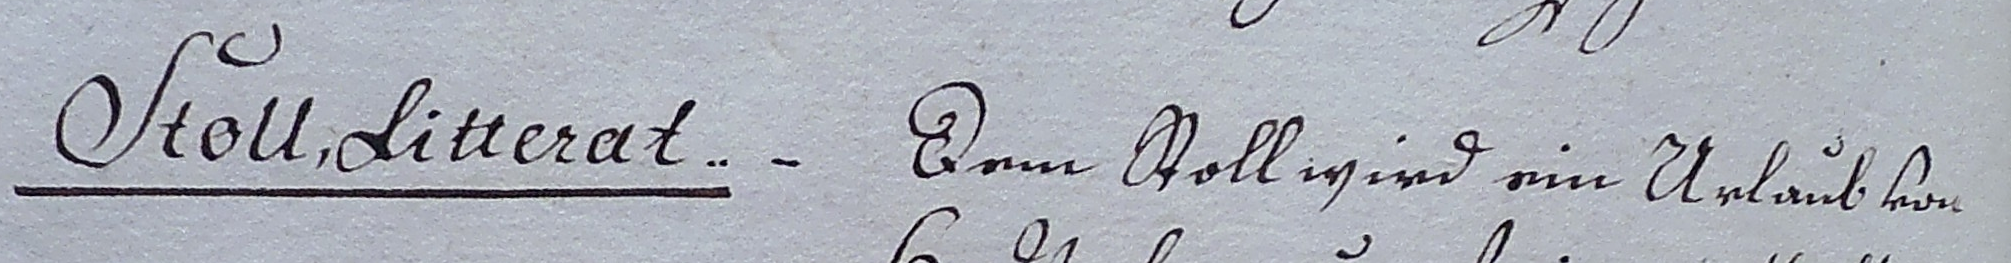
Stoll, Litterat .. .. Dem Stoll wird ein Urlaub von
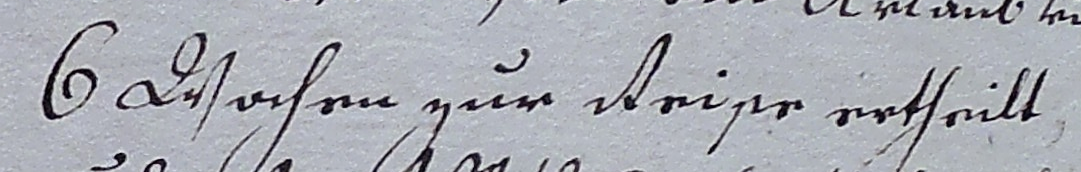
6 Wochen zur Reise ertheilt
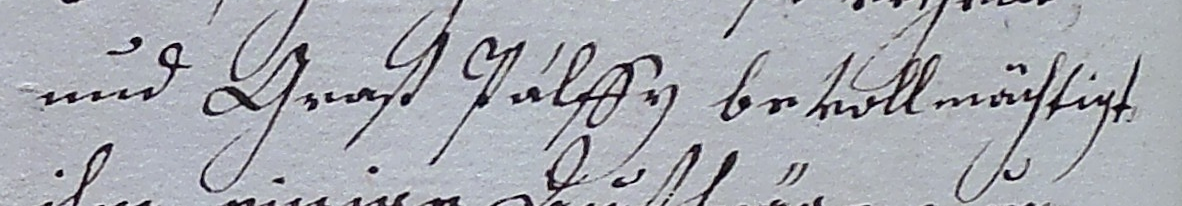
und Graf Pálffy bevollmächtigt
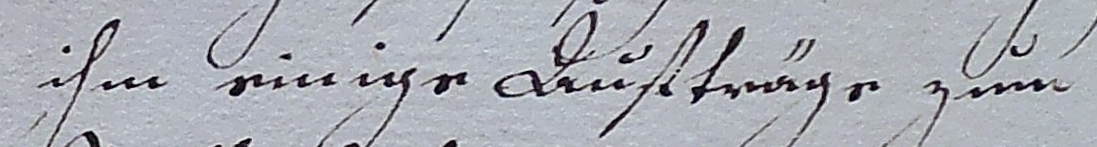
ihm einige Aufträge zum
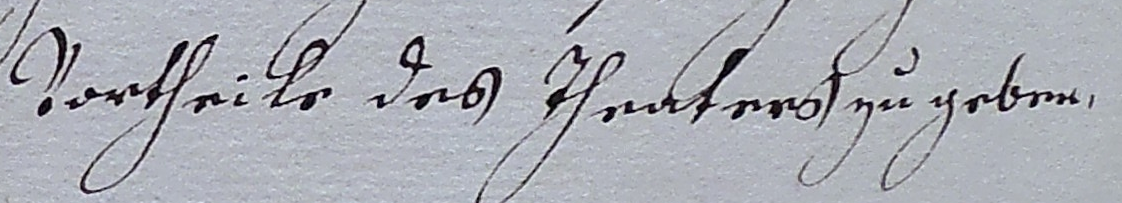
Vortheile des Theaters zu geben.
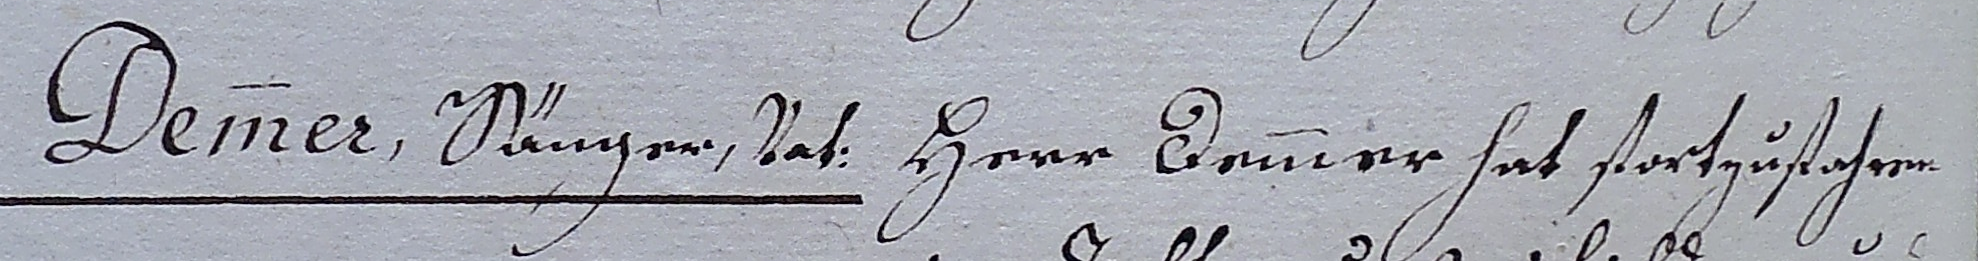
Dem̅er, Sänger, Vat: Herr Dem̅er hat fortzufahren
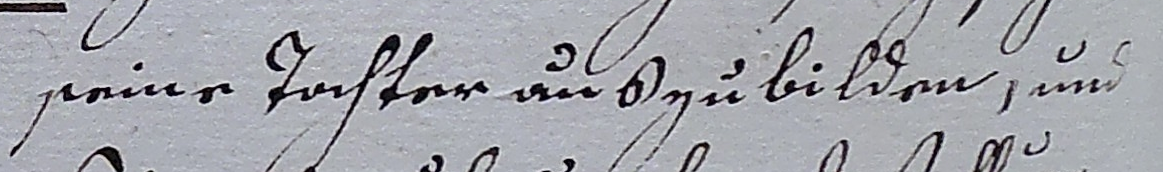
seine Tochter auszubilden, und
